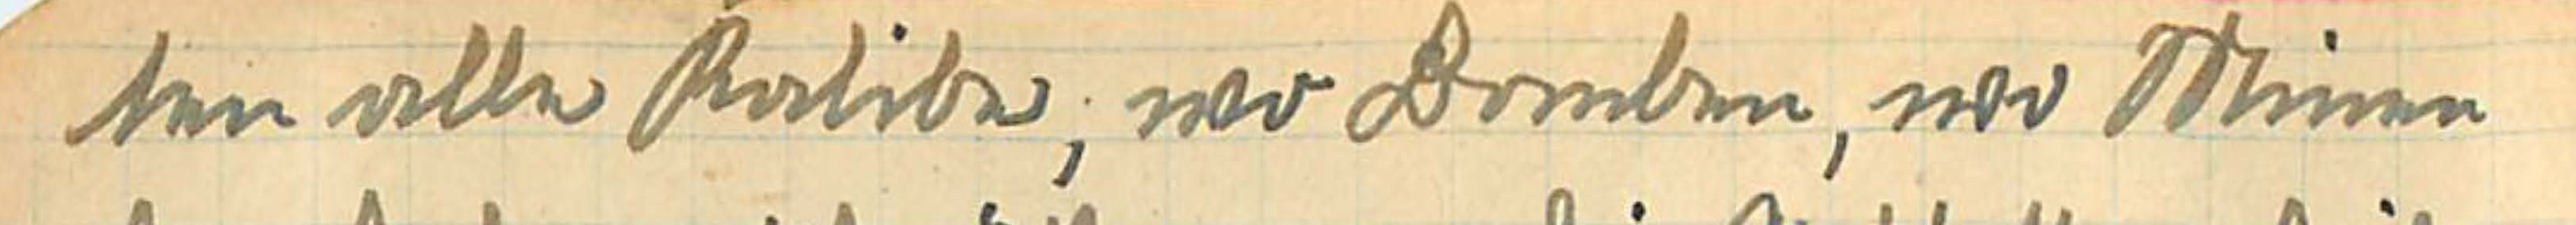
ten aller Kaliber, wo Bomben, wo Minen
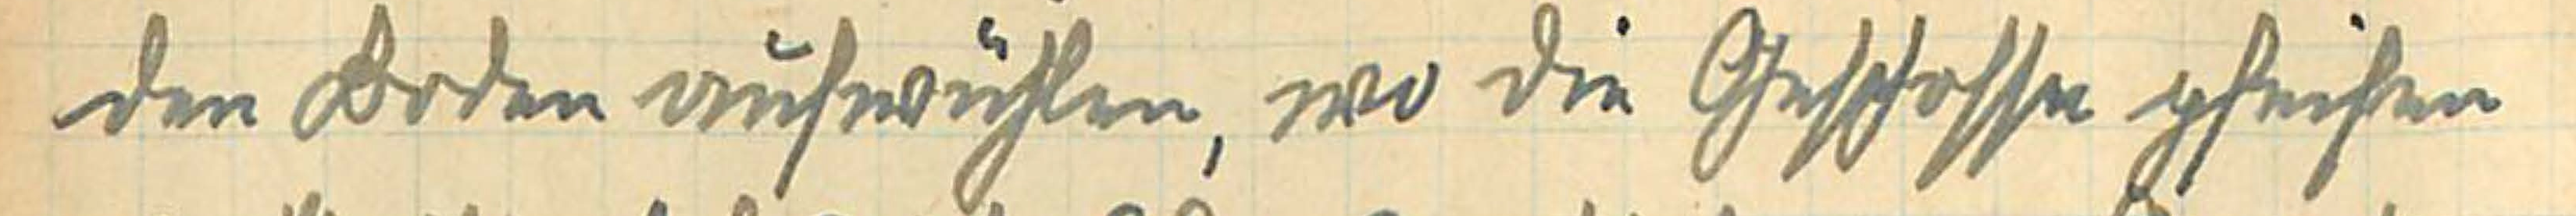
den Boden aufwühlen, wo die Geschosse pfeifen
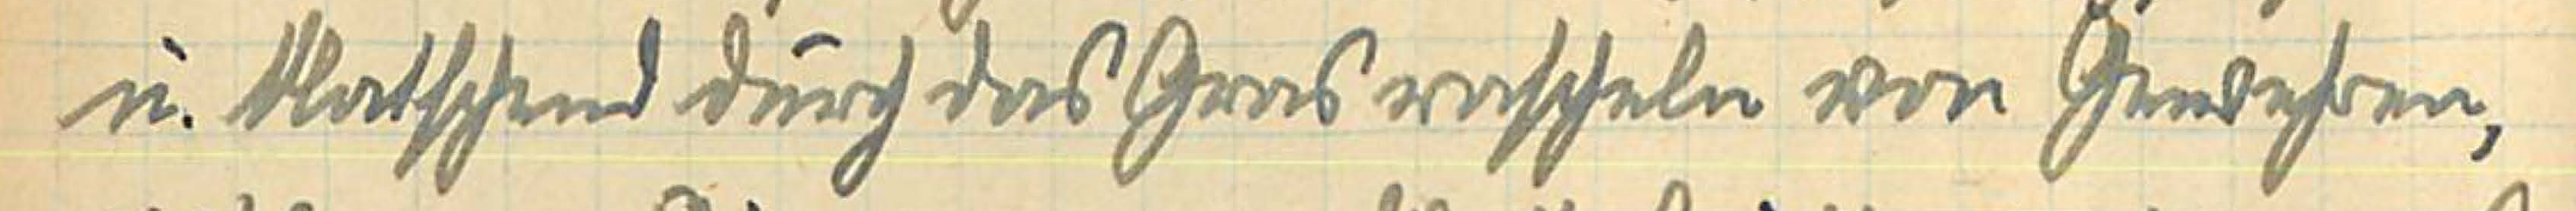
u. klatschend durch das Gras rascheln von Gewehren,
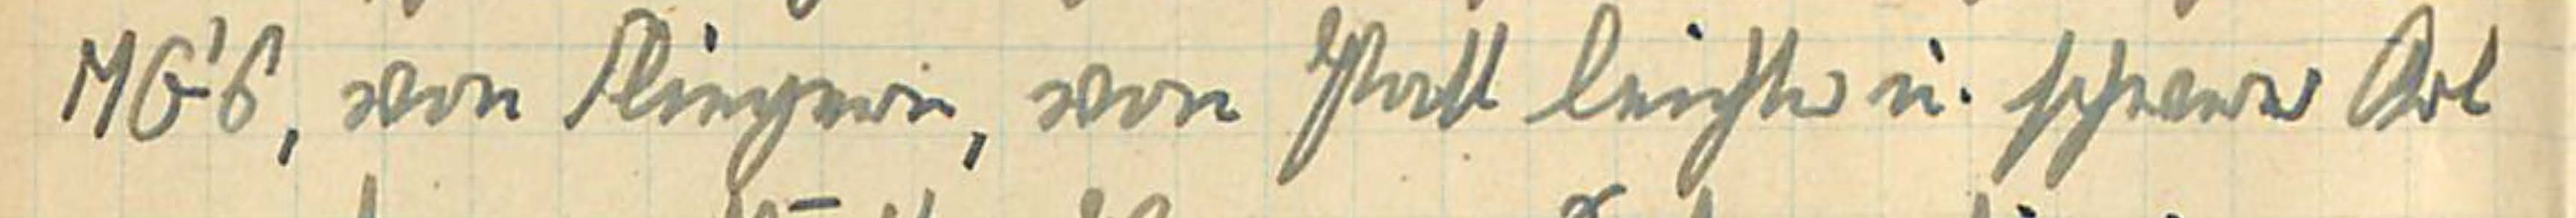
MG's, von Fliegern, von Pak leichter u. schwerer Art
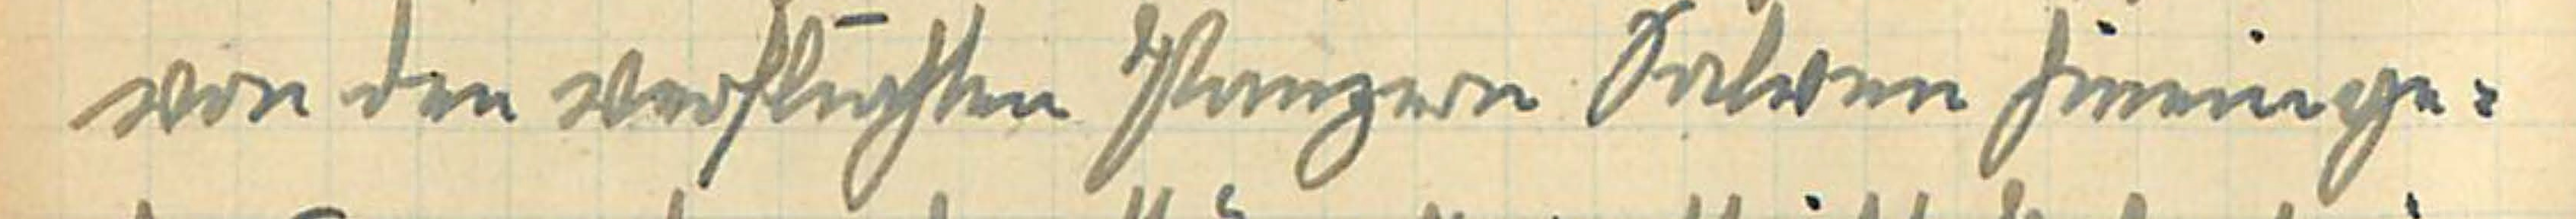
von den verfluchten Panzern Salven hineinge-
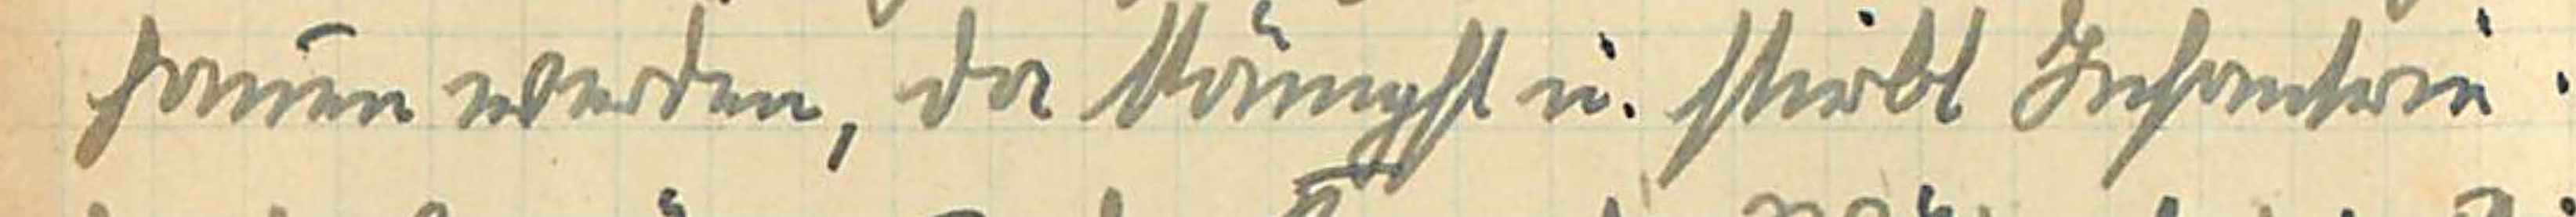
hauen werden, da kämpft u. stirbt Infantrie.
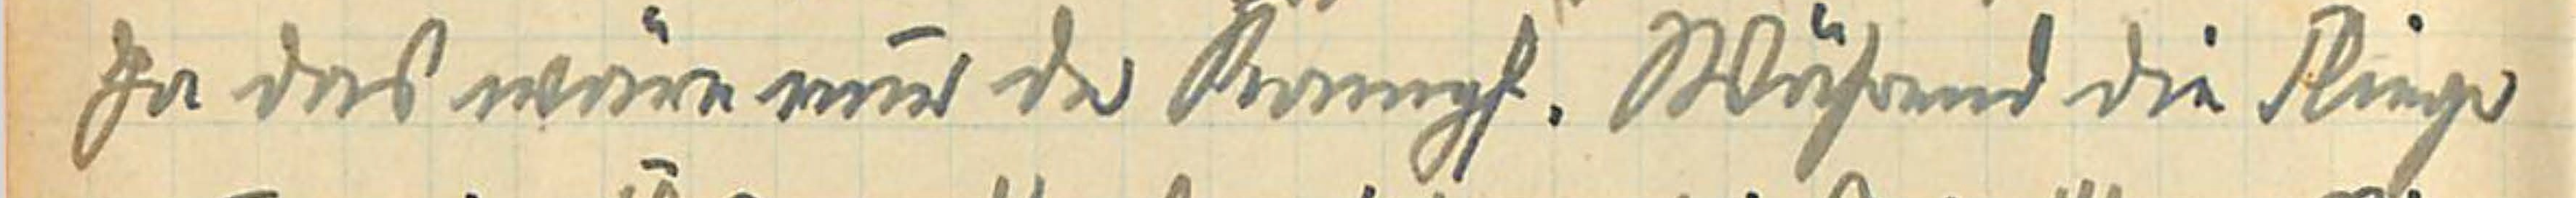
Ja das wäre nur der Kampf. Während die Flieger
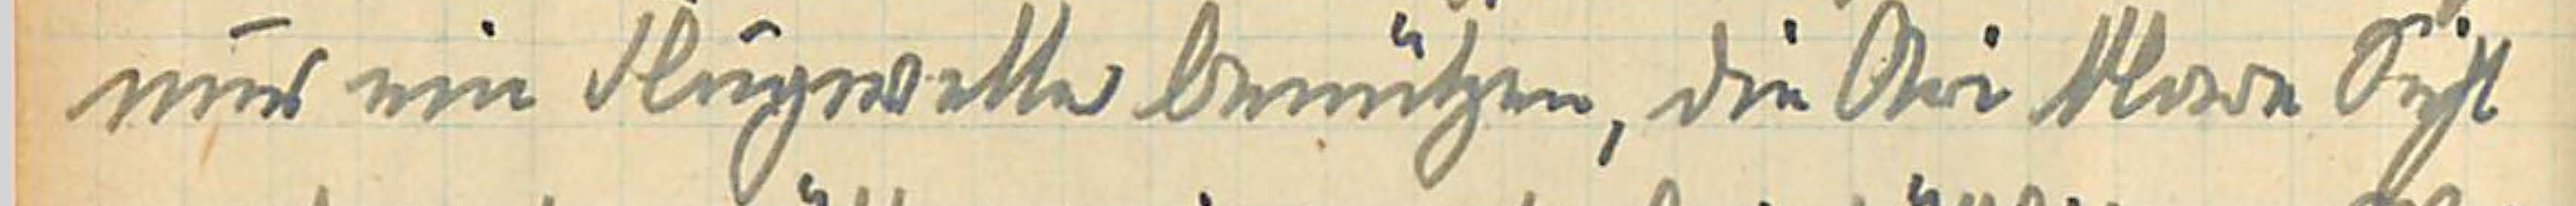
nur ein Flugwetter benützen, die Ari klare Sicht
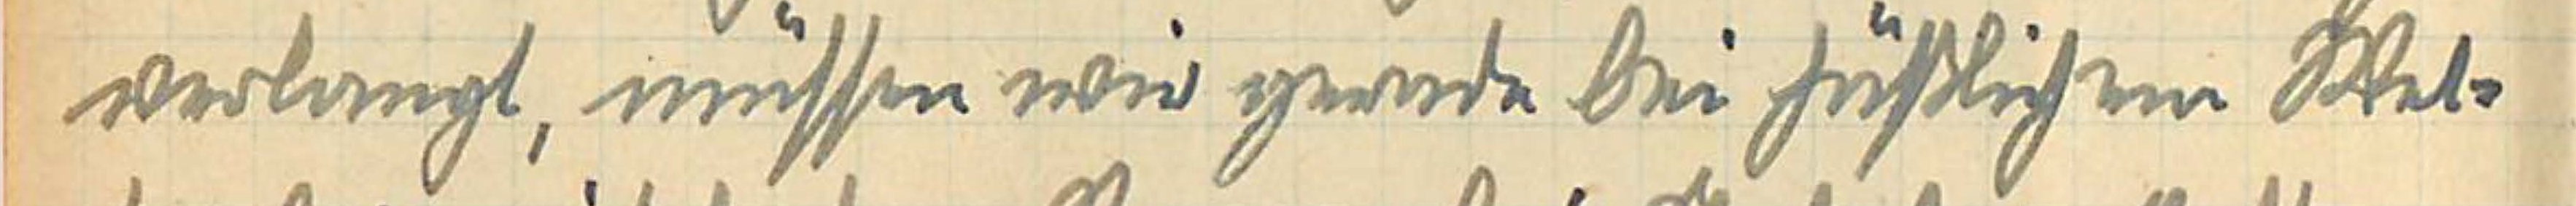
verlangt, müssen wir gerade bei häßlichem Wet-
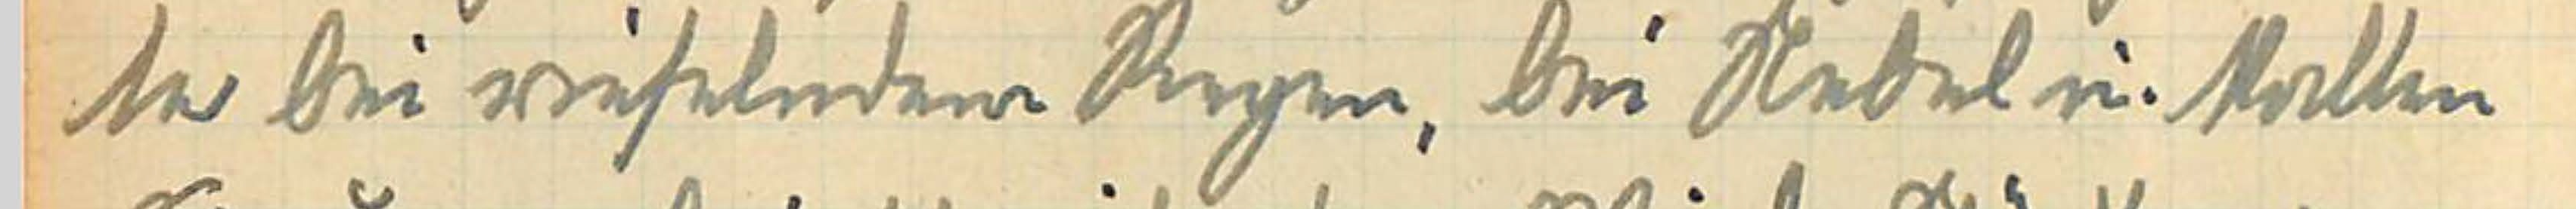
ter bei rieselndem Regen, bei Nebel u. kalten
